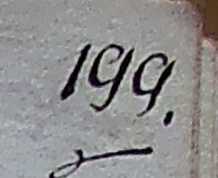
199.
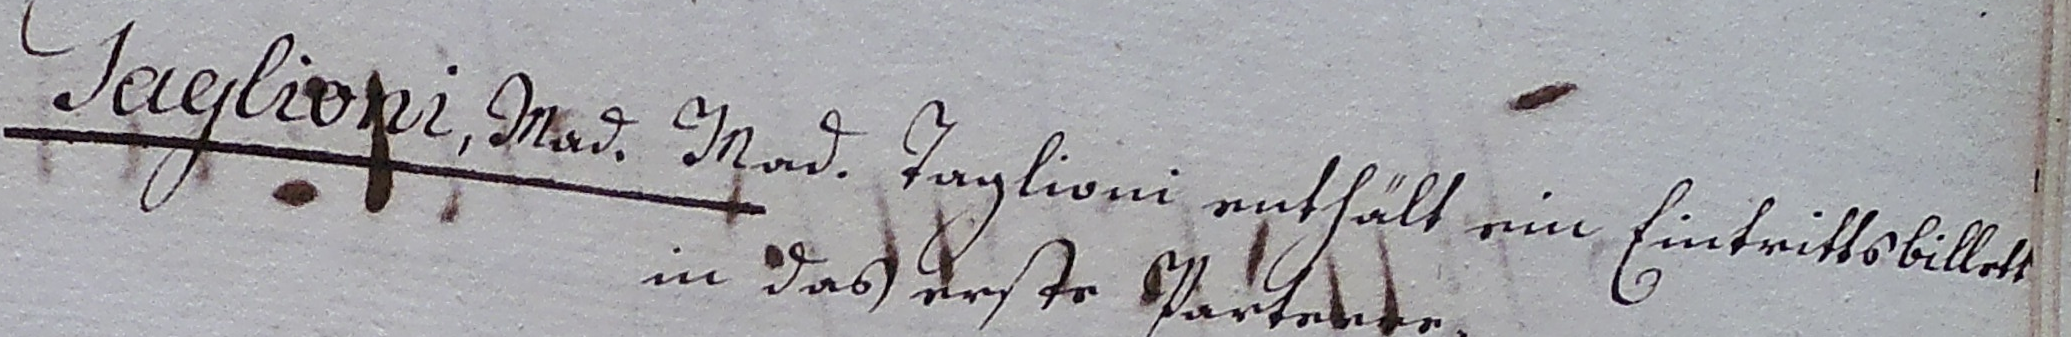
Taglioni, Mad. Mad. Taglioni enthält ein Eintrittsbillett
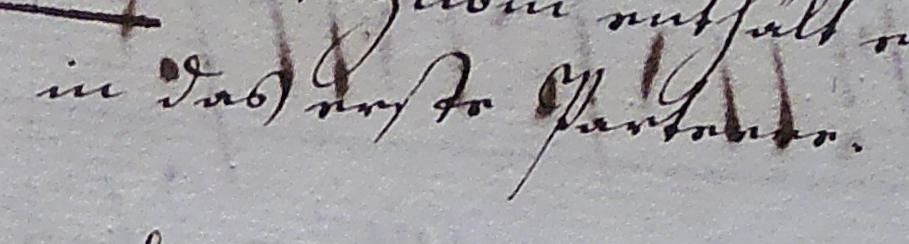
in das erste Parterre.
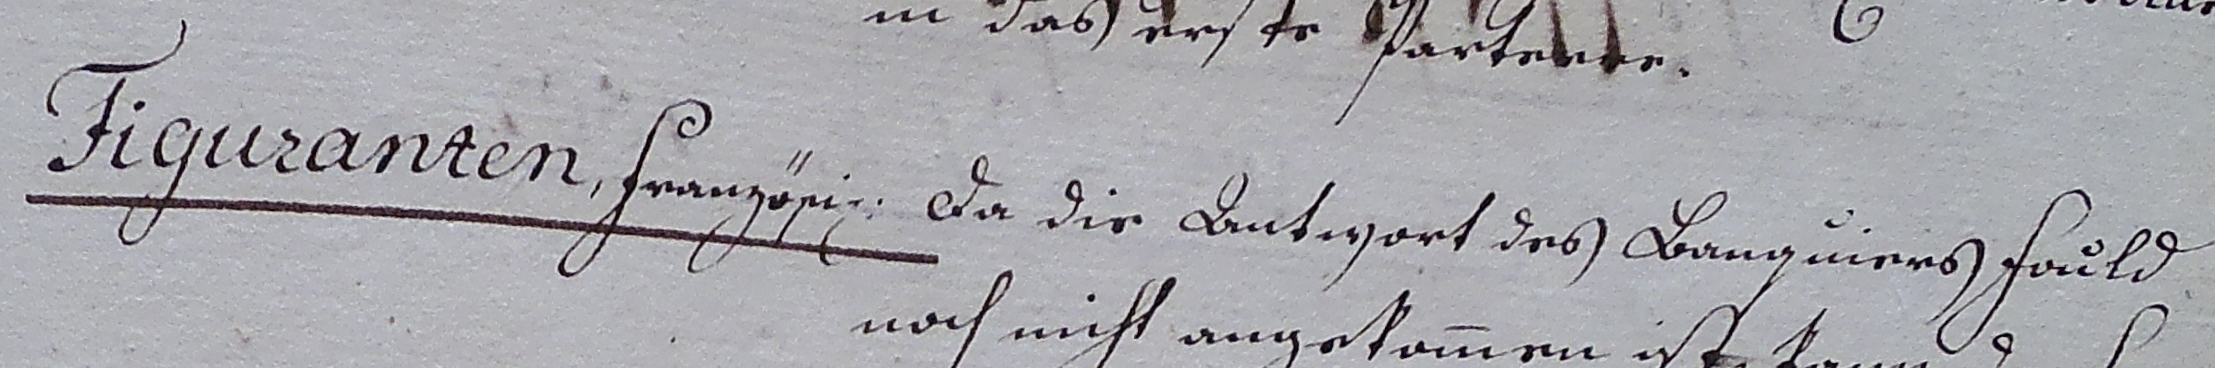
Figuranten, Französis: Da die Antwort des Banquiers Fould
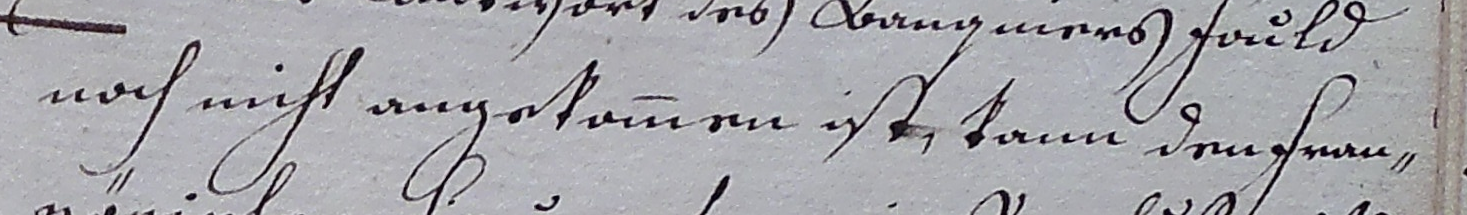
noch nicht angekom̅en ist, kann den Fran¬
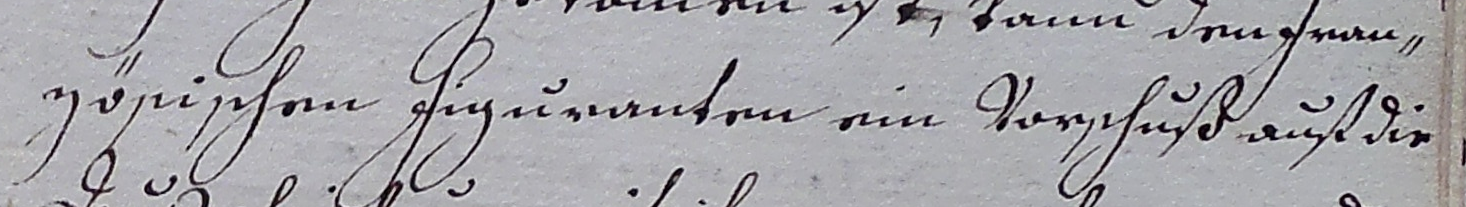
zösischen Figuranten ein Vorschuß auf die
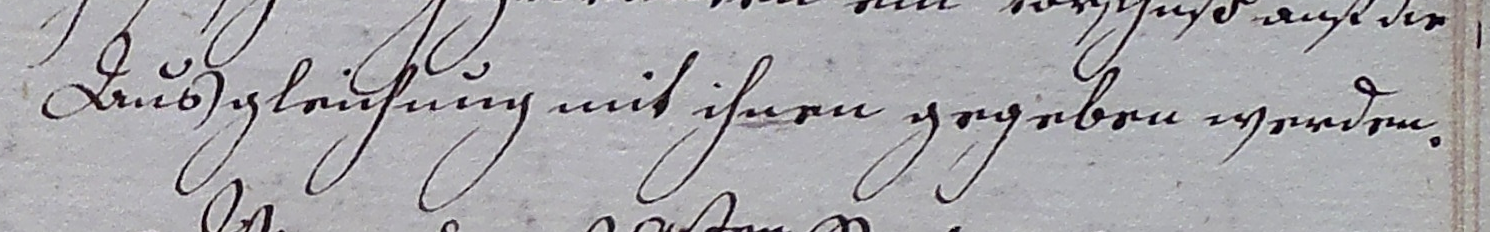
Ausgleichung mit ihnen gegeben werden.
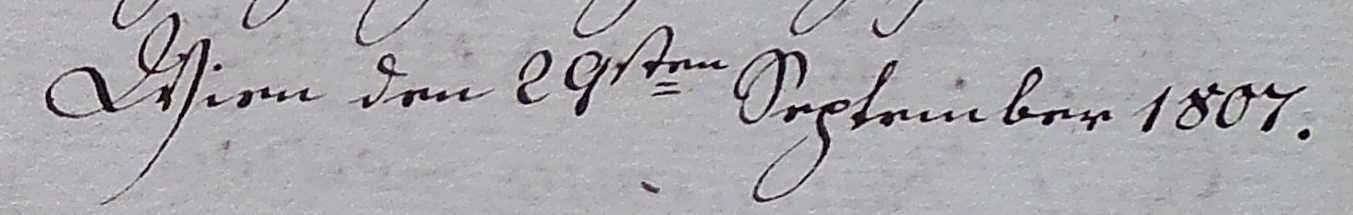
Wien den 29ste͇n September 1807.
